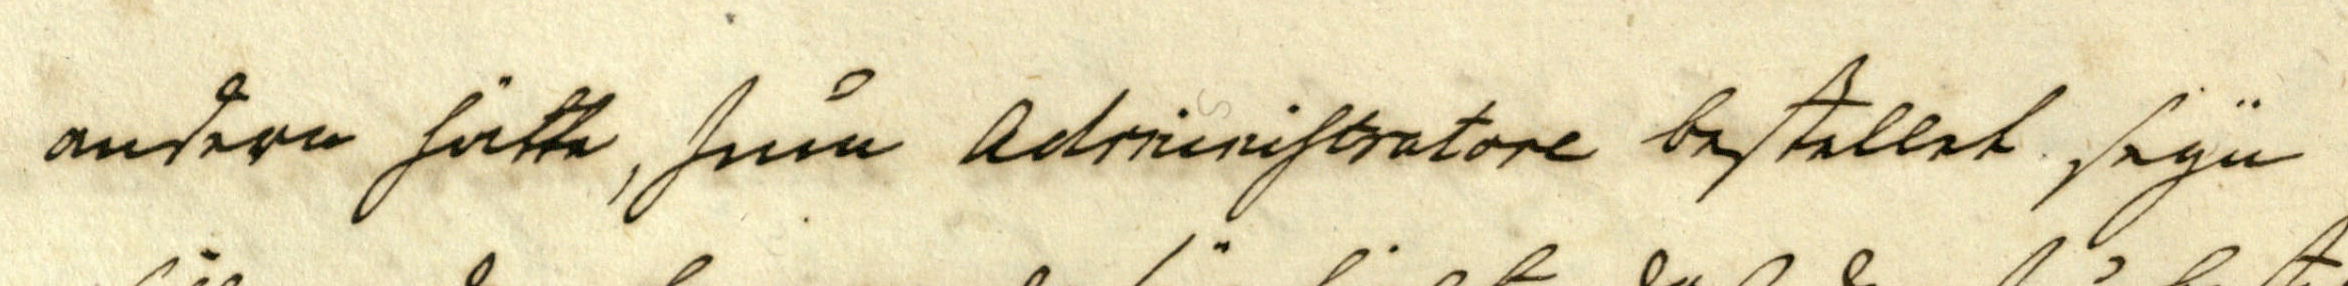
andern hätte, zum Administratore bestellet seÿn
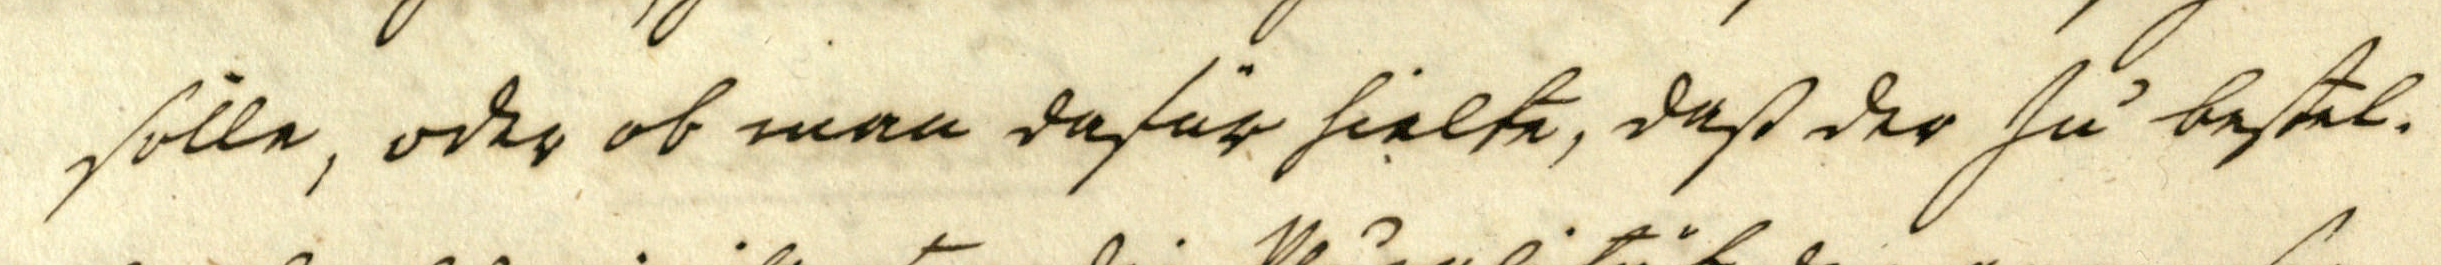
solle, oder ob man dafür hielte, daß der zu bestel¬
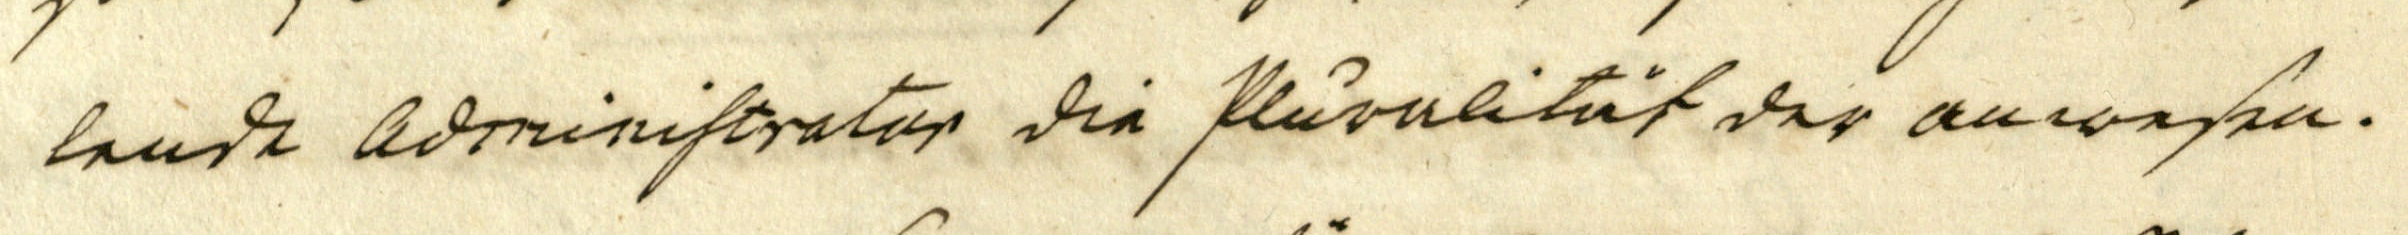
lende Administrator die Pluralität der anwesen¬
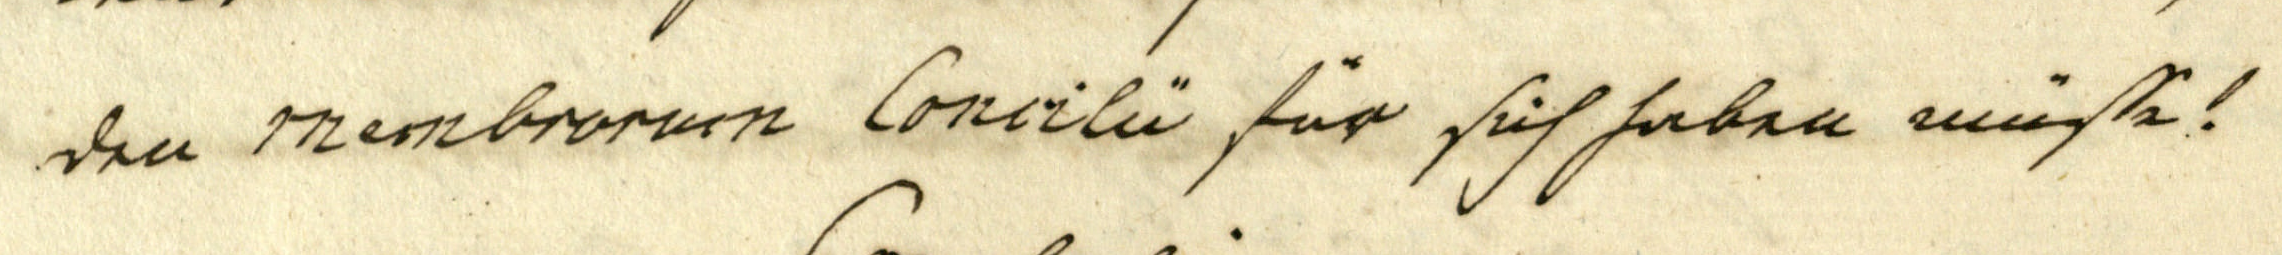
den membrorum Concilii für sich haben müsse?
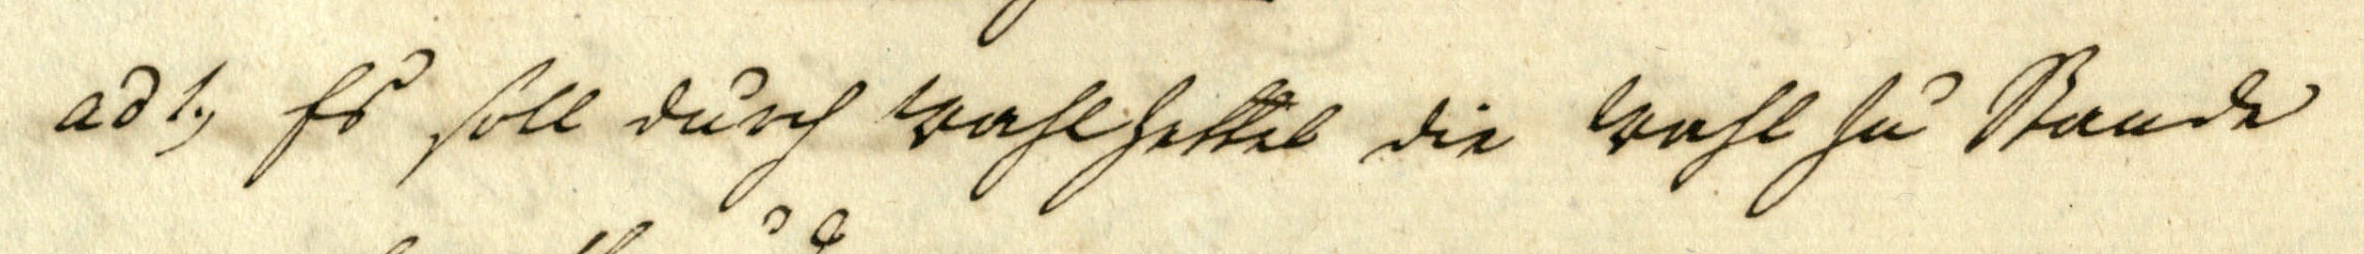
ad 1.,. Es soll durch Wahlzettel die Wahl zu Stande
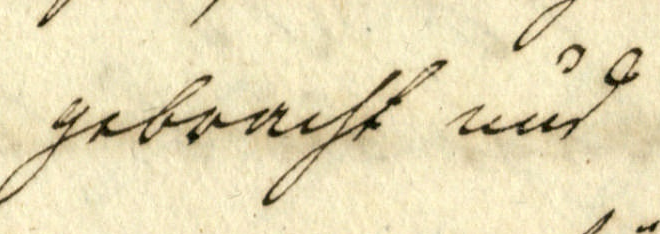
gebracht und
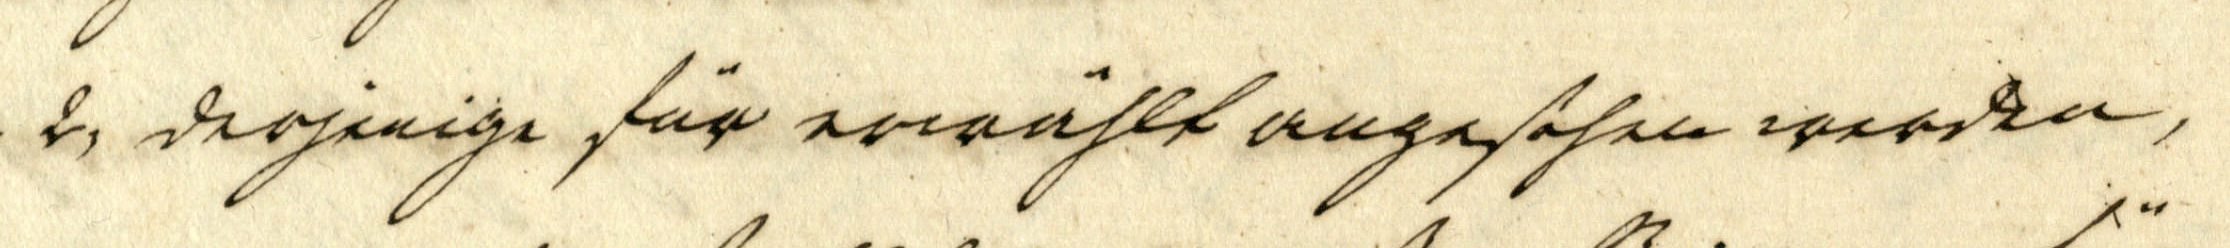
2., derjenige für erwählt angesehen werden,
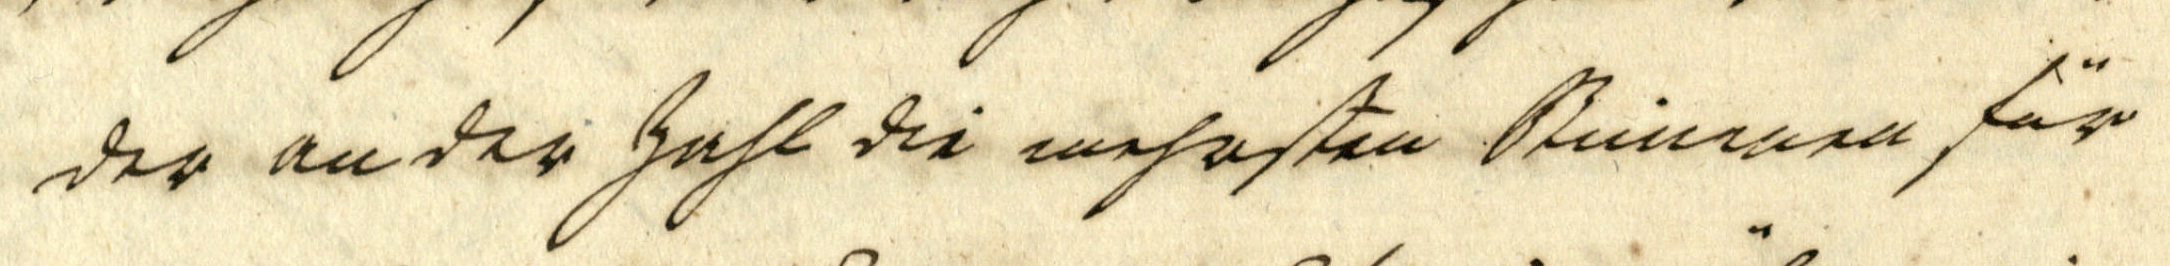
der an der Zahl die mehrsten Stimmen für
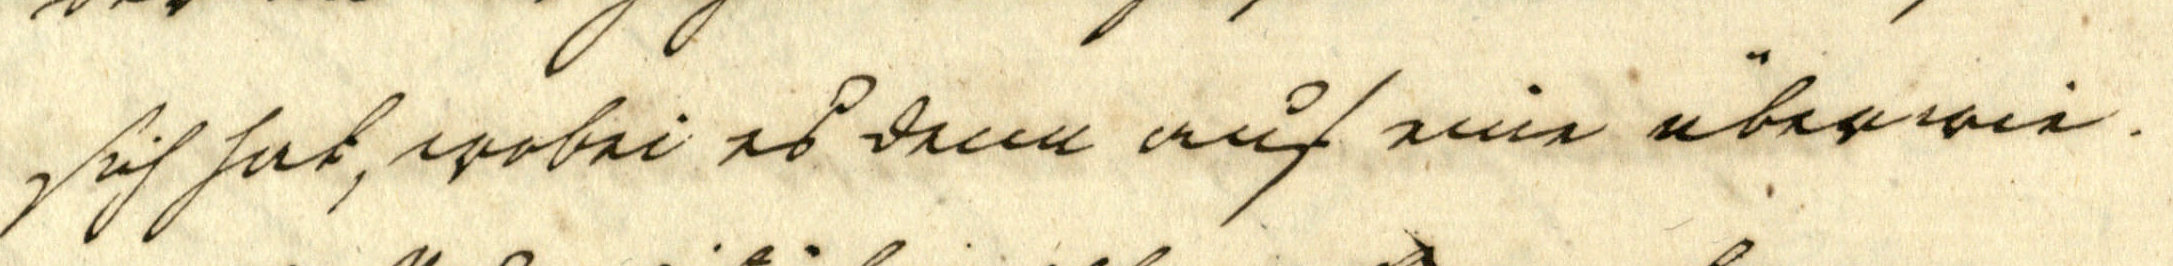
sich hat, wobei es den auf eine überwie¬
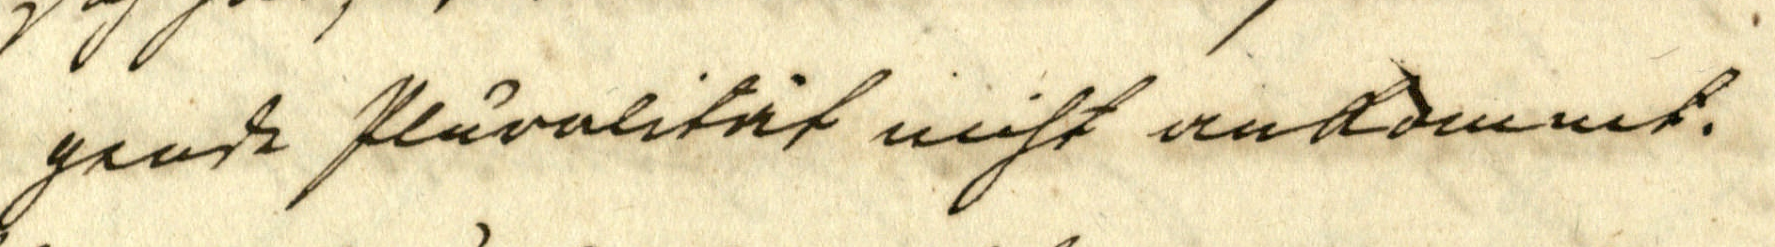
gende Pluralität nicht ankommt.
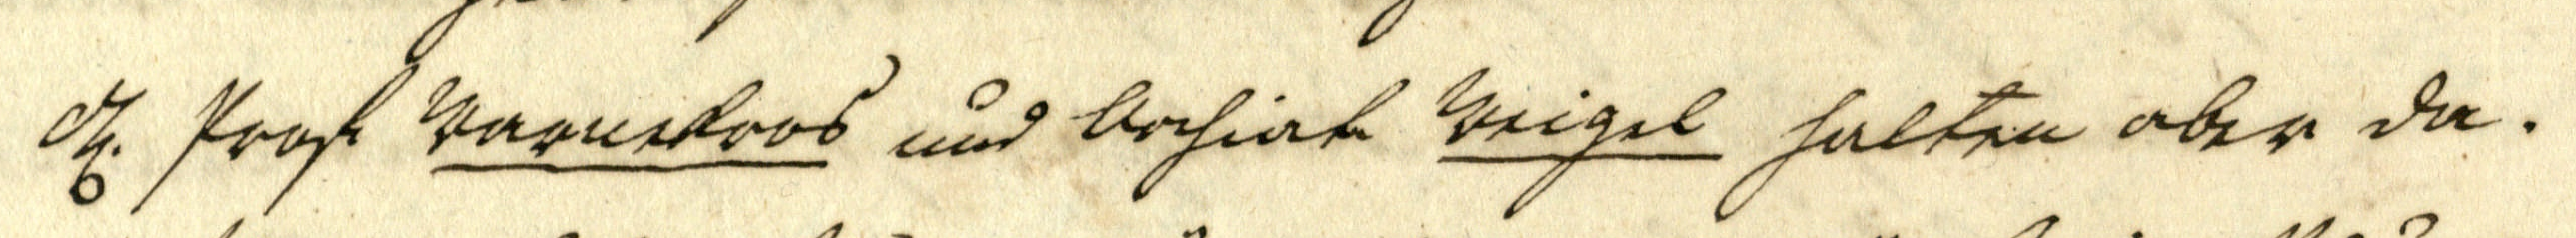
dh. Prof. Warnekros und Archiat. Weigel halten aber da¬
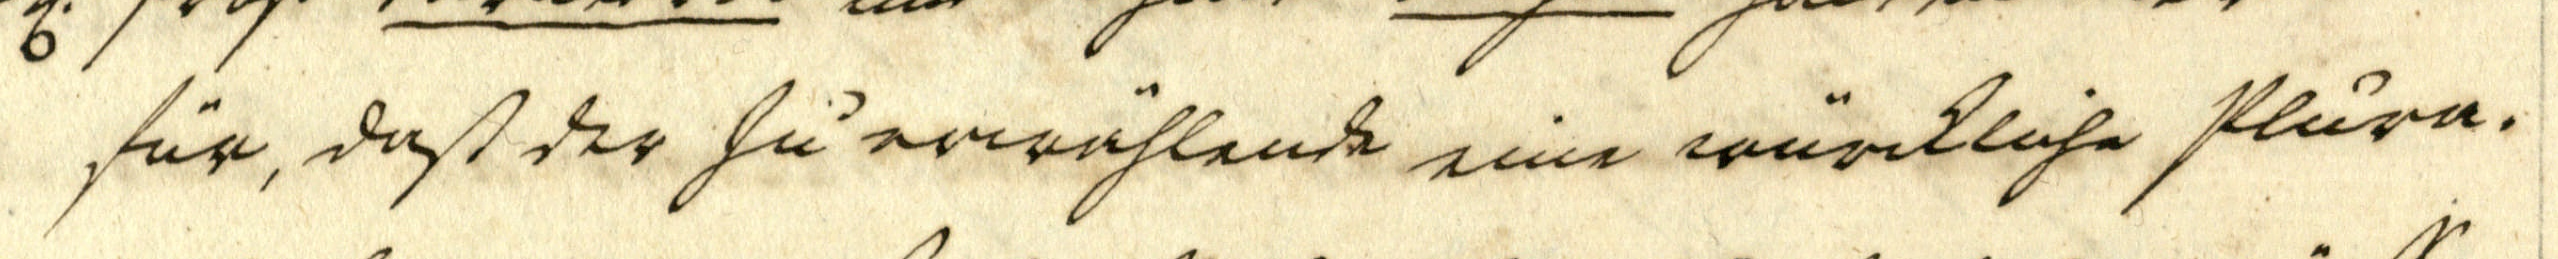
für, daß der zu erwählende eine würckliche Plura¬
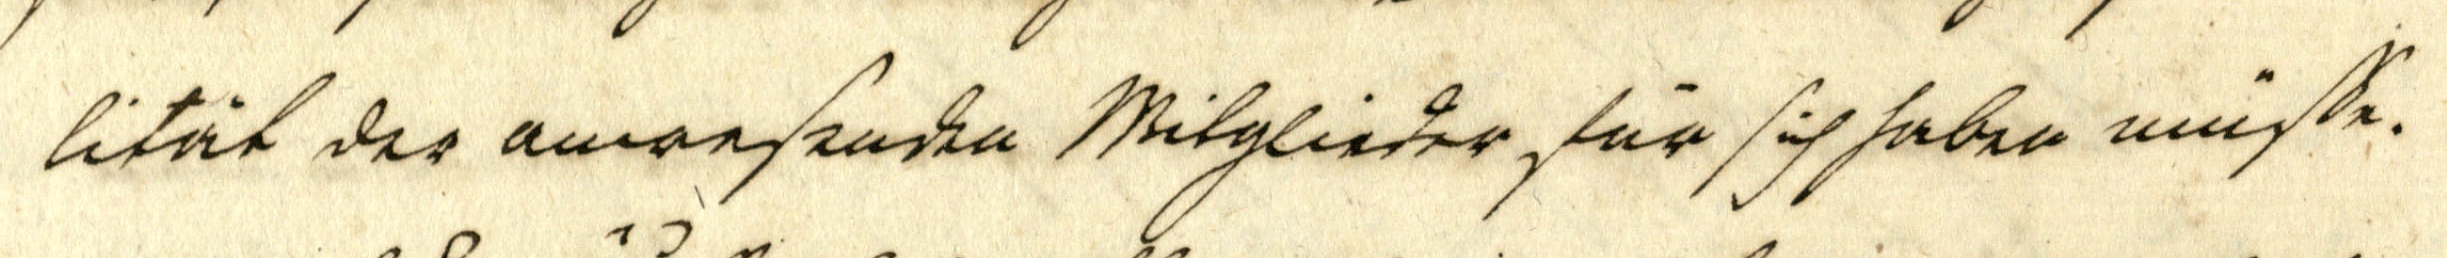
lität der anwesenden Mitglieder für sich haben müsse.
